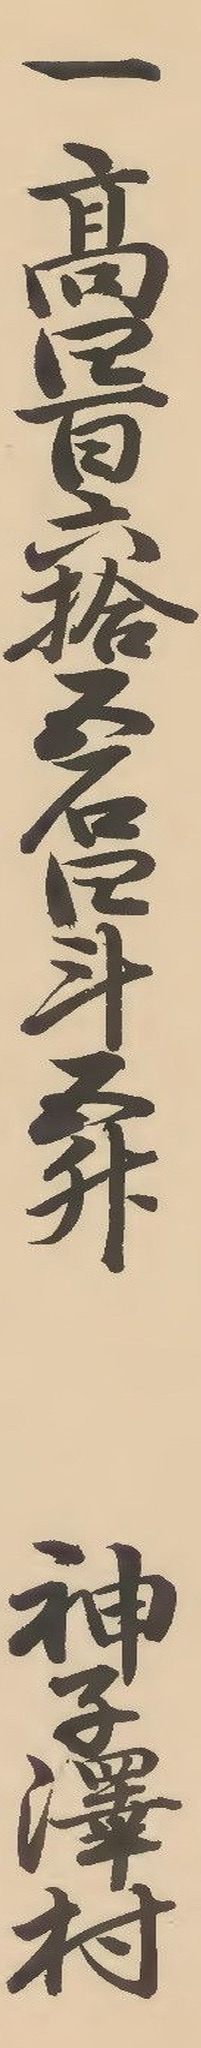一高百六拾五石四斗五升神子沢村
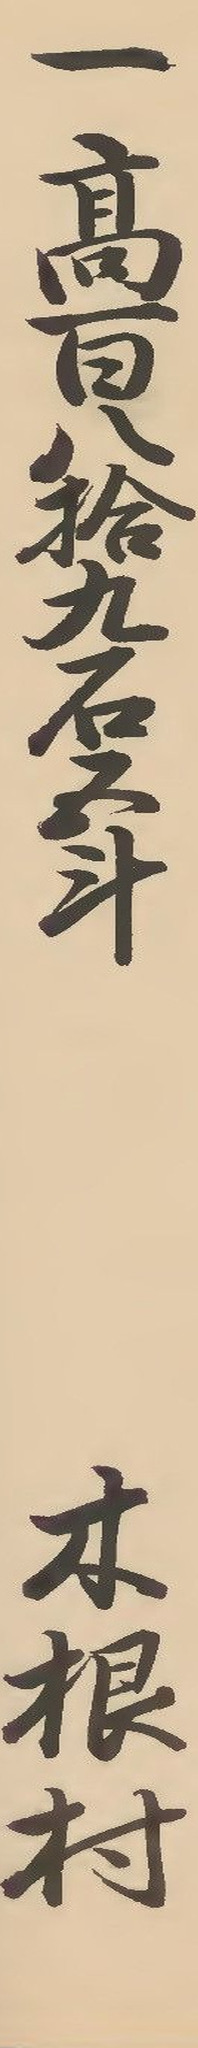一高百八拾九石五斗木根村
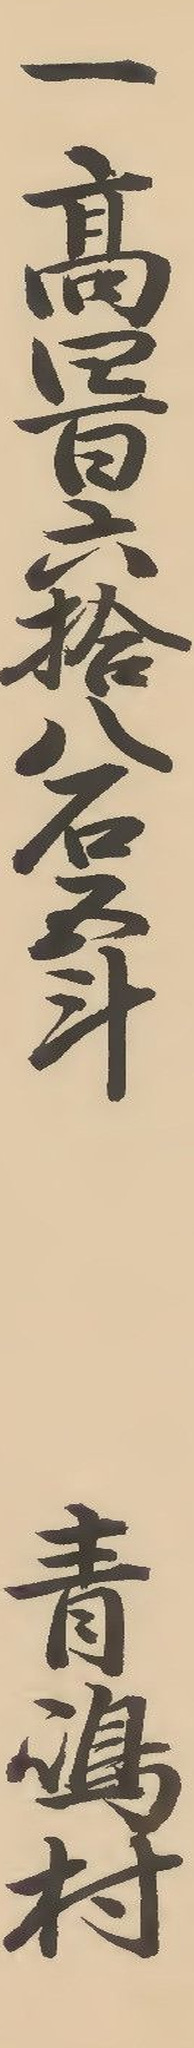一高四百六拾八石五斗青島村

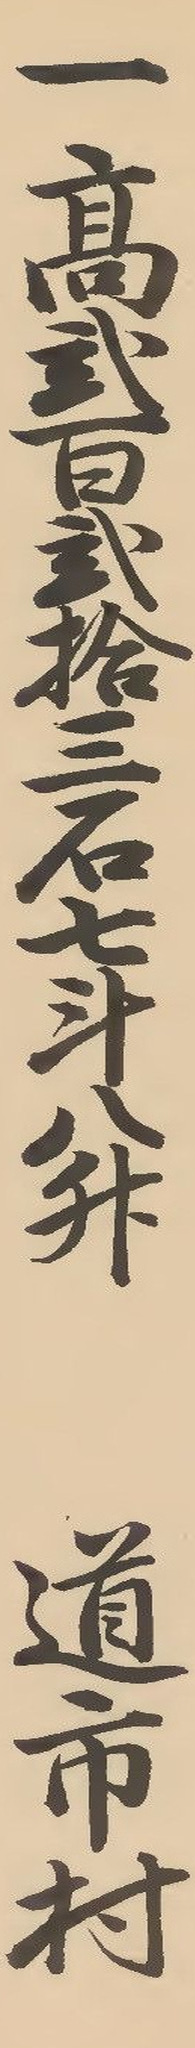一高弐百弐拾三石七斗八升道市村
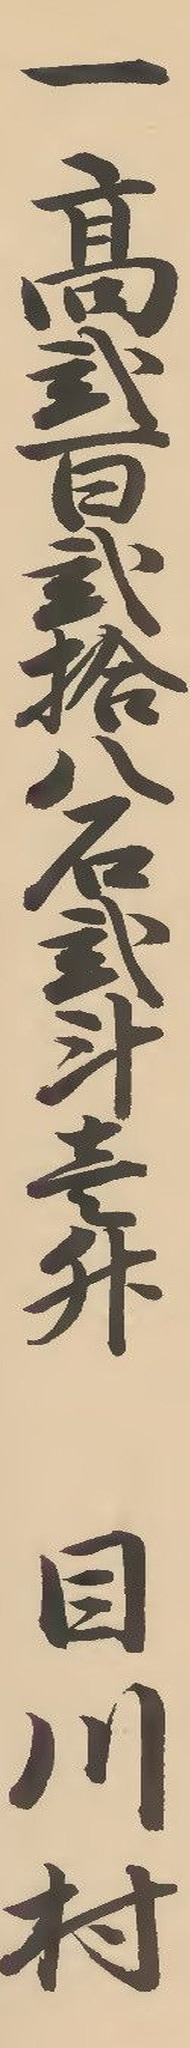一高弐百弐拾八石弐斗壱升目川村
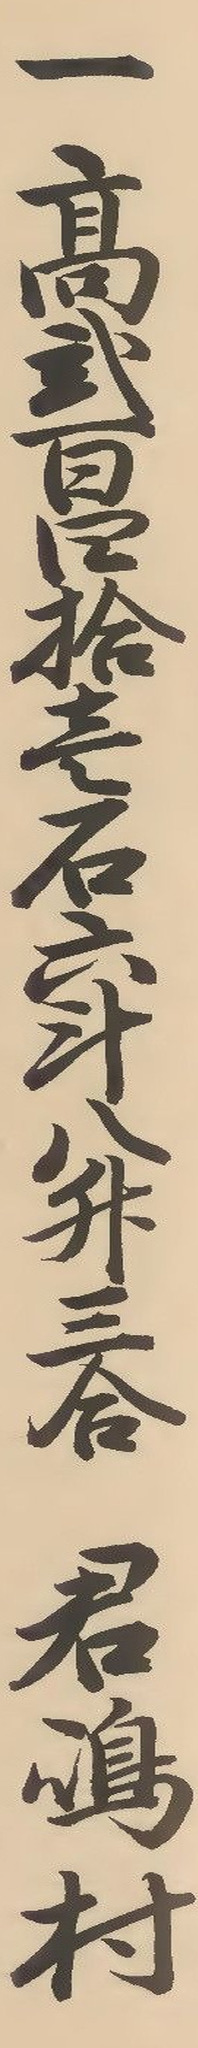一高弐百四拾壱石六斗八升三合君島村
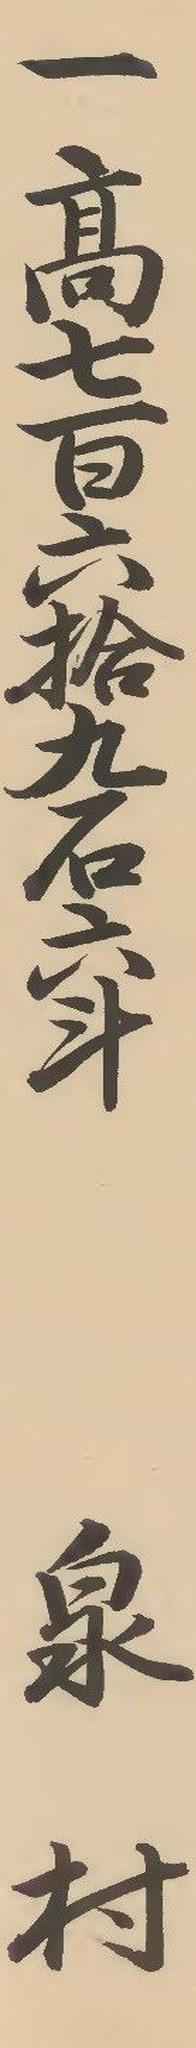一高七百六拾九石六斗泉村
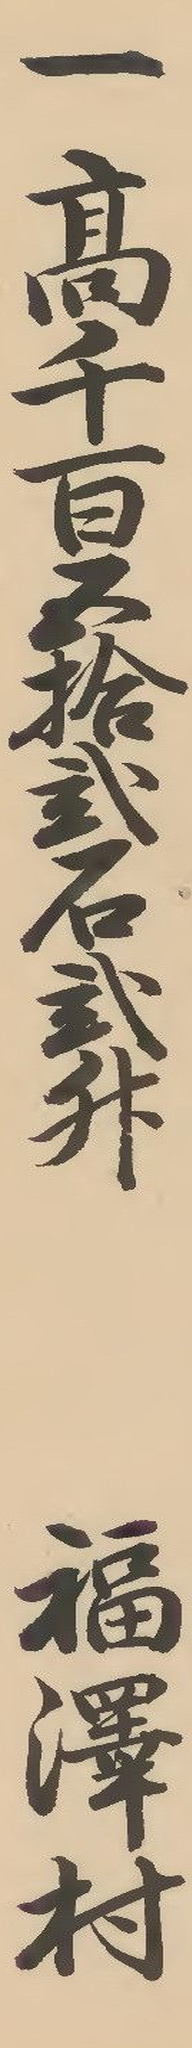一高千百五拾弐石弐升福沢村

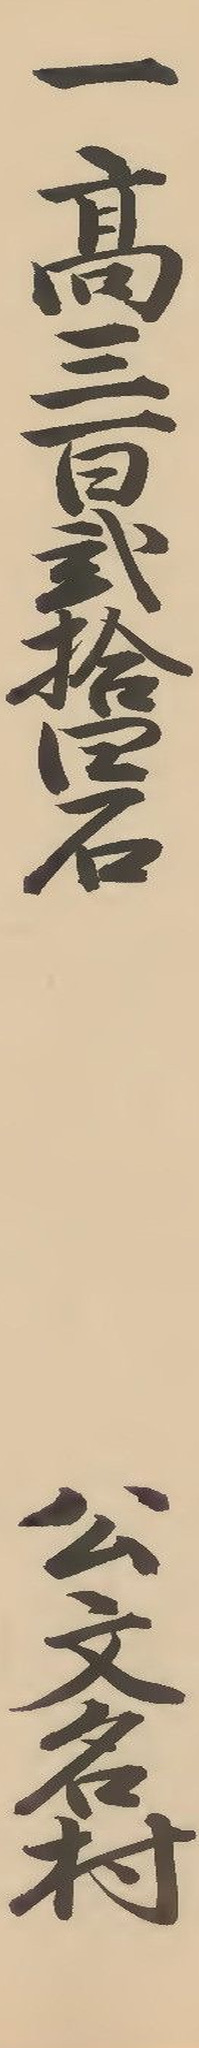一高三百弐拾四石公文名村
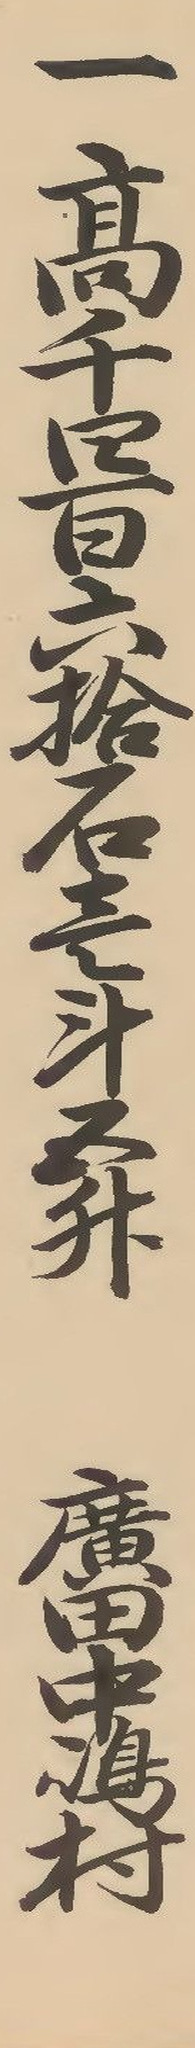一高千四百六拾石壱斗五升広田中島村
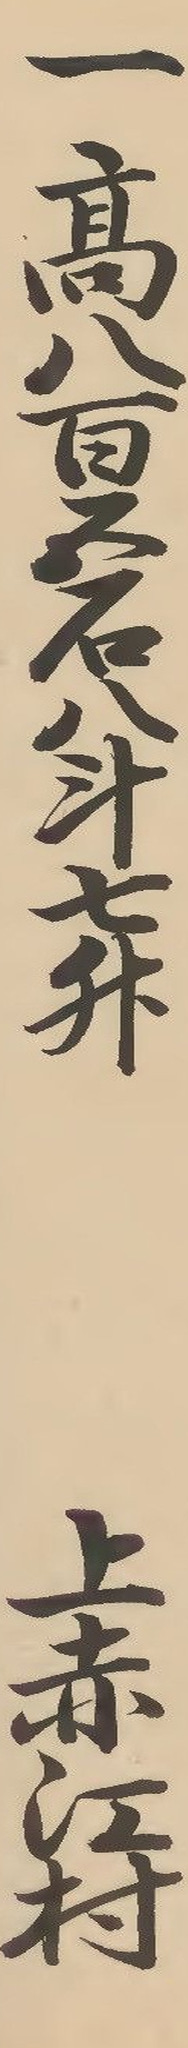一高八百五石八斗七升上赤江村
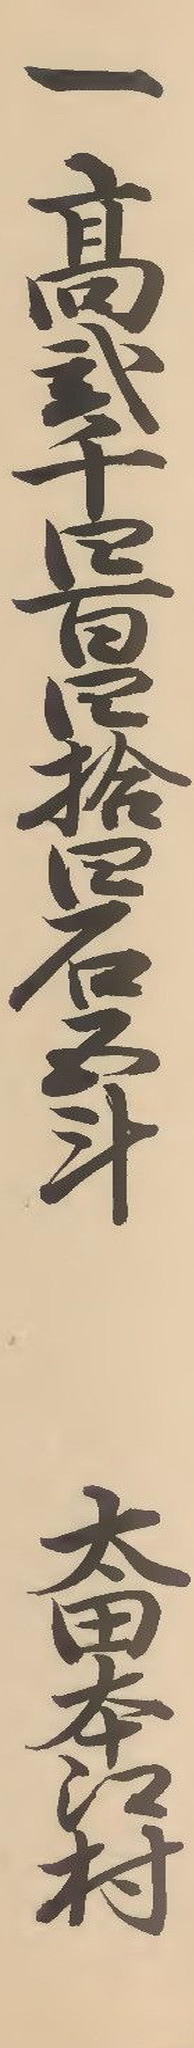一高弐千四百四拾四石五斗太田本江村
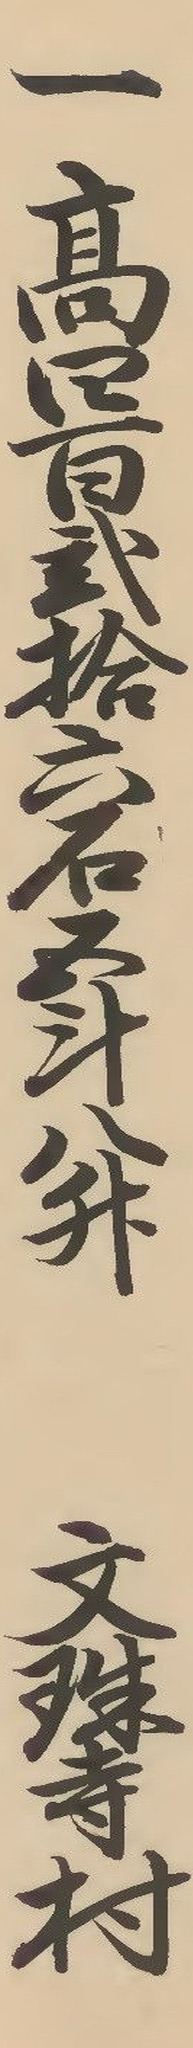一高四百弐拾六石五斗八升文珠寺村
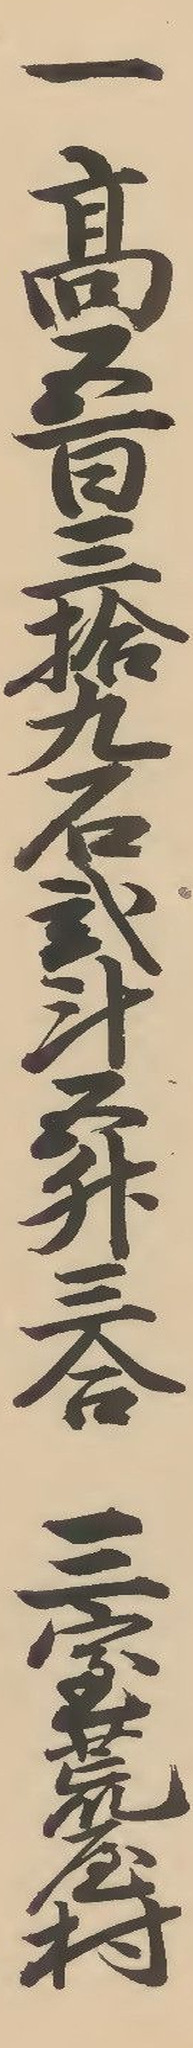一高五百三拾九石弐斗五升三合三室荒屋村

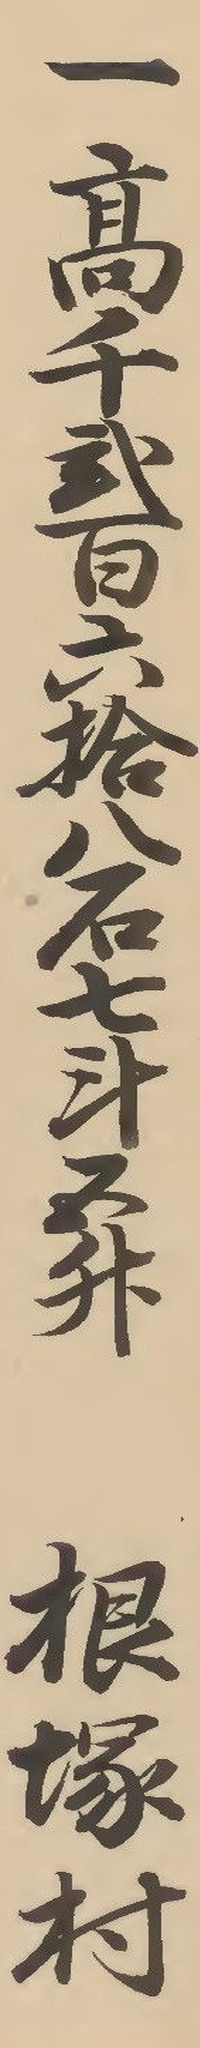一高千弐百六拾八石七斗五升根塚村
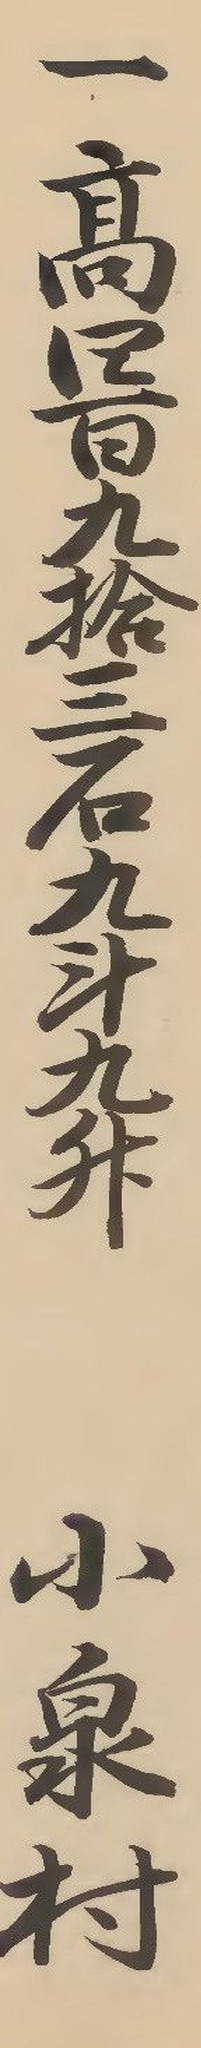一高四百九拾三石九斗九升小泉村
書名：越中国郷帳
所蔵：国立公文書館 National Archives of Japan
